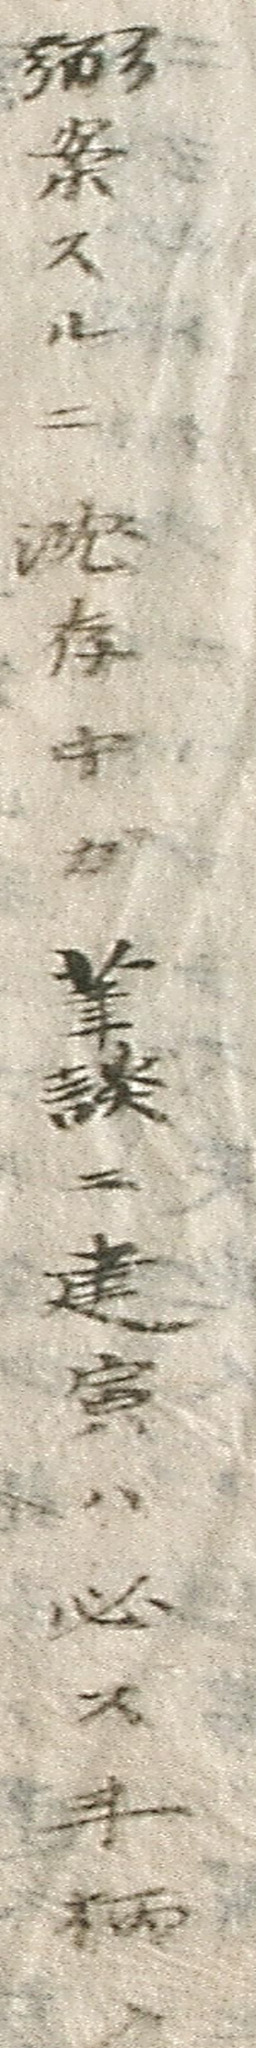弼案スルニ沈存中ガ葦談ニ建寅ハ必ス斗柄ノ
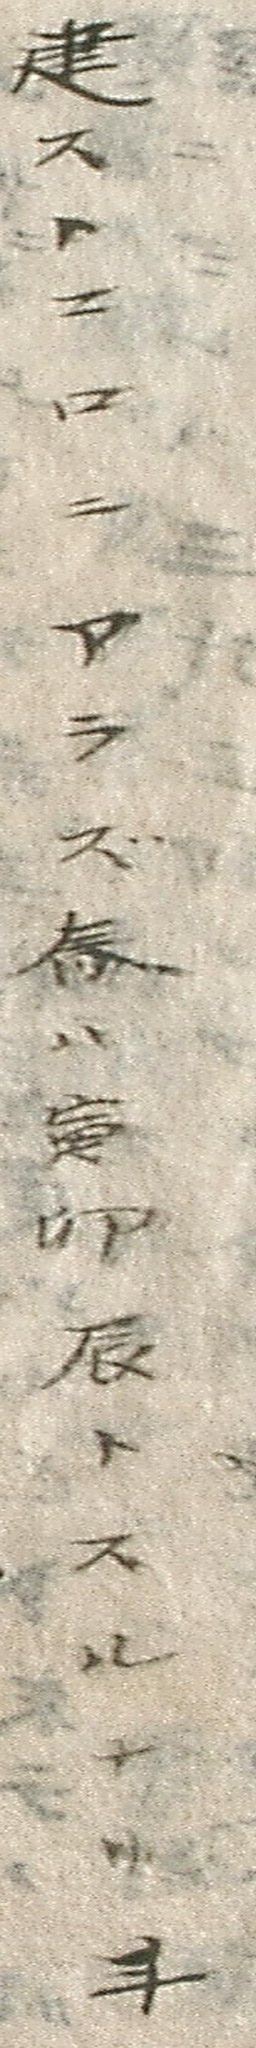建ストコロニアラズ春ハ寅卯辰トスルナリ斗
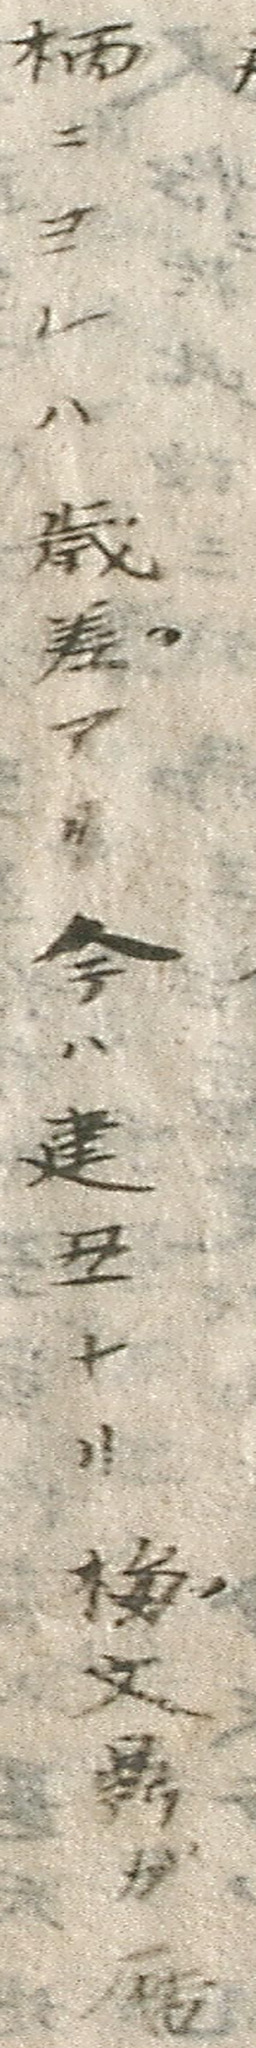柄ニヨレハ歳差アリ今ハ建丑ナリ梅文鼎ガ暦
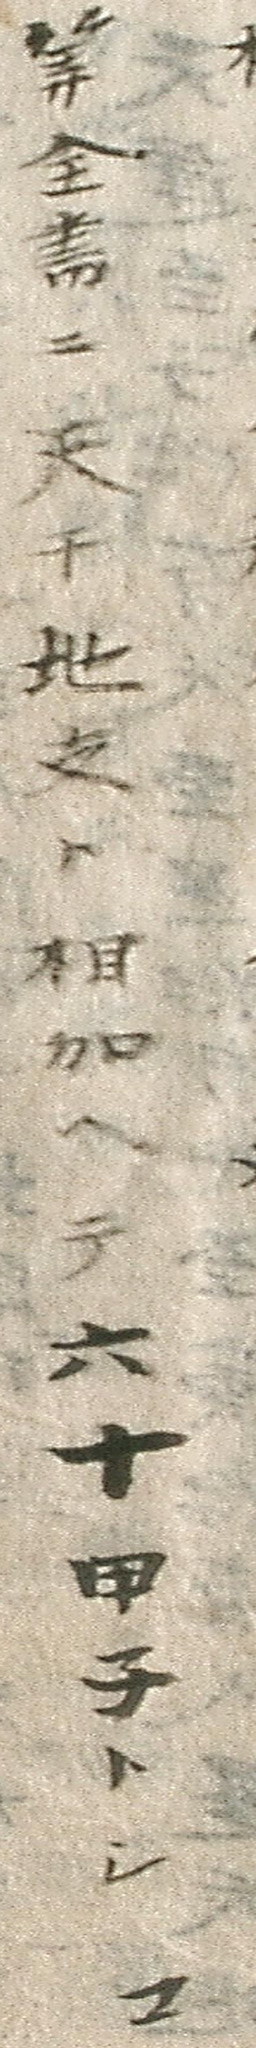等全書ニ天干地支ト相加ヘテ六十甲子トシコ
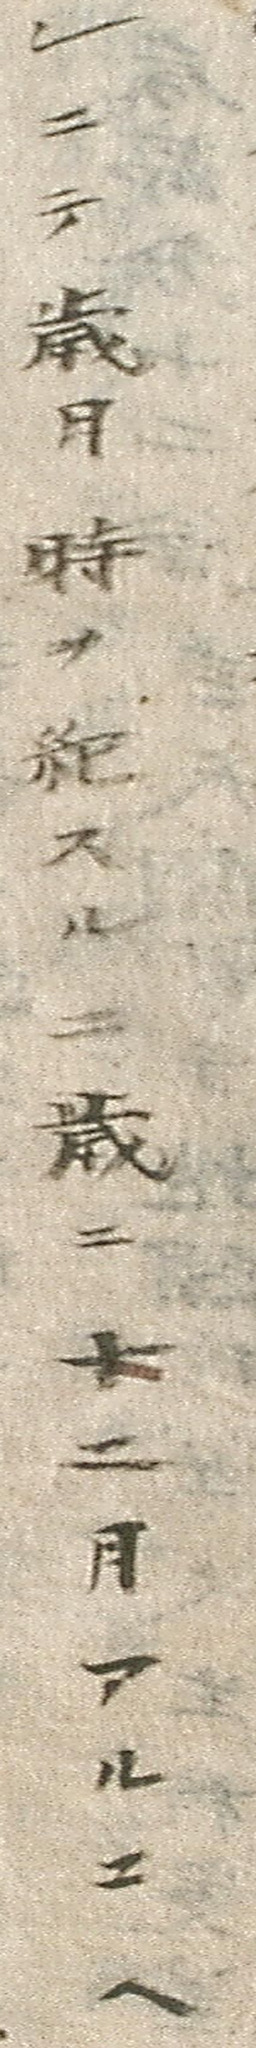レニテ歳月時ヲ紀スルニ歳ニ十二月アルユヘ
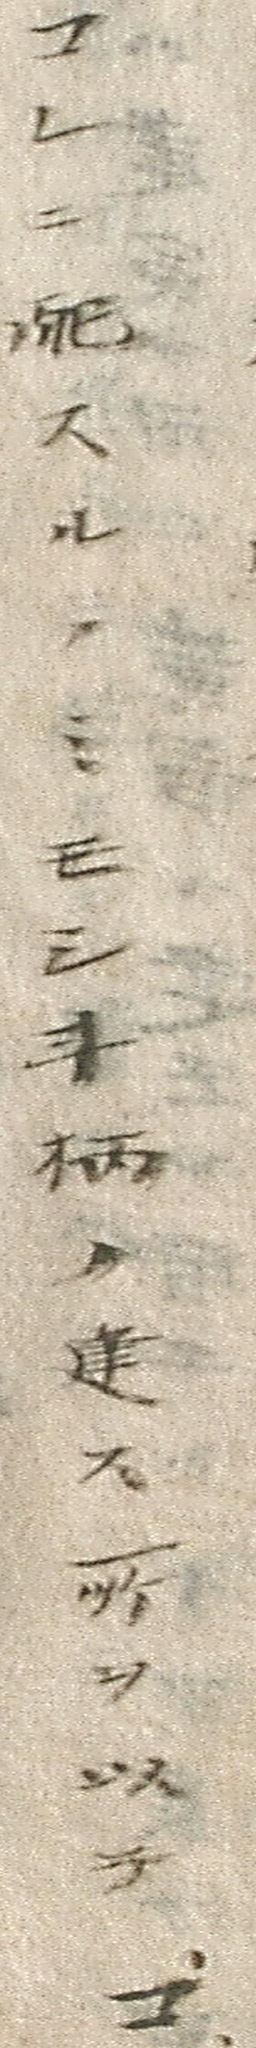コレニ配スルノミモシ斗柄ノ建ス所ヲ以テコ
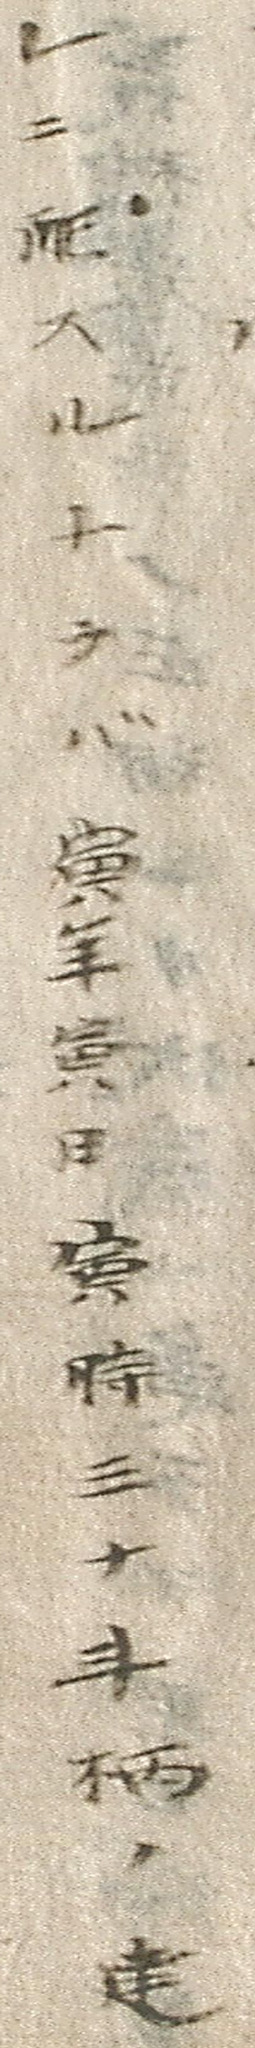レニ配スルナラバ寅年寅日寅時ミナ斗柄ノ建
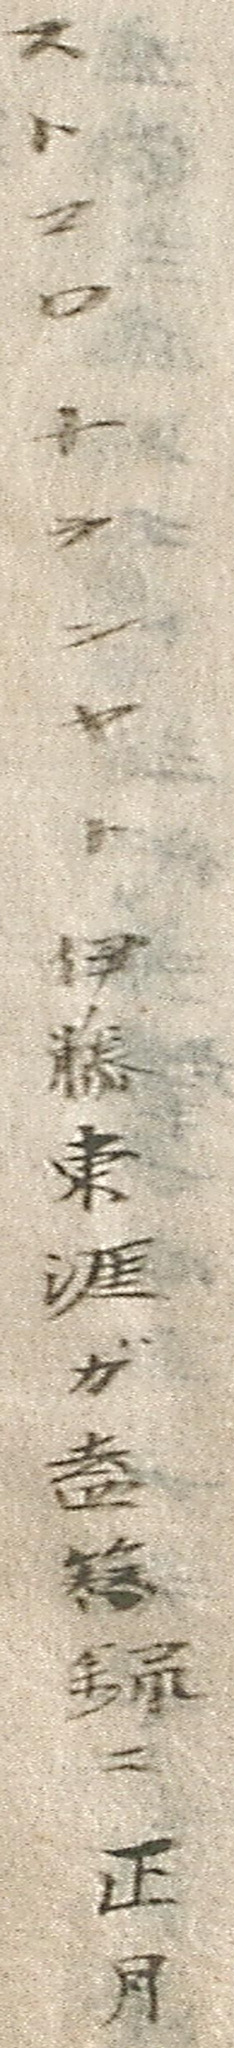ストコロナランヤト伊藤東涯ガ盍簪録ニ正月
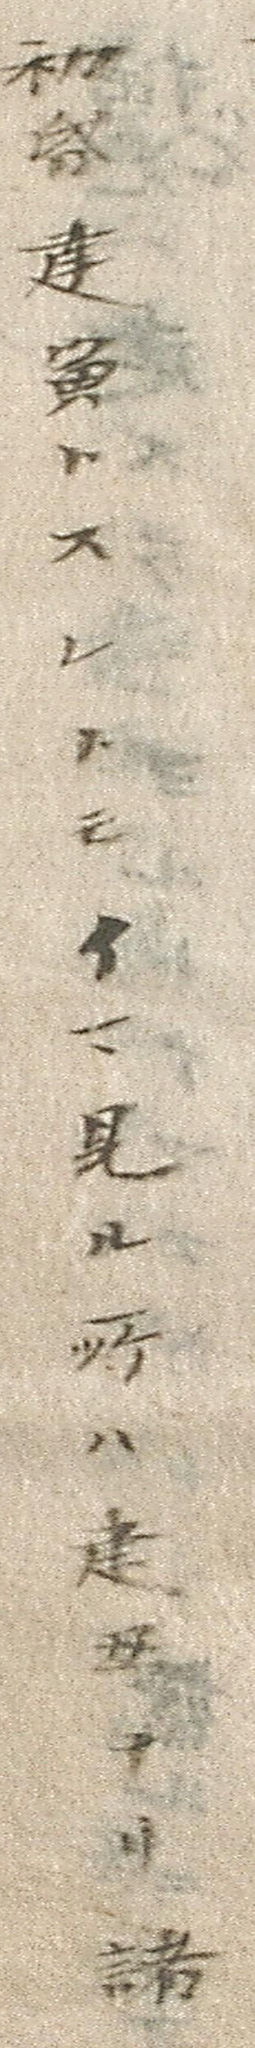初昏建虎トスレトモイマ見ル所ハ建丑ナリ諸
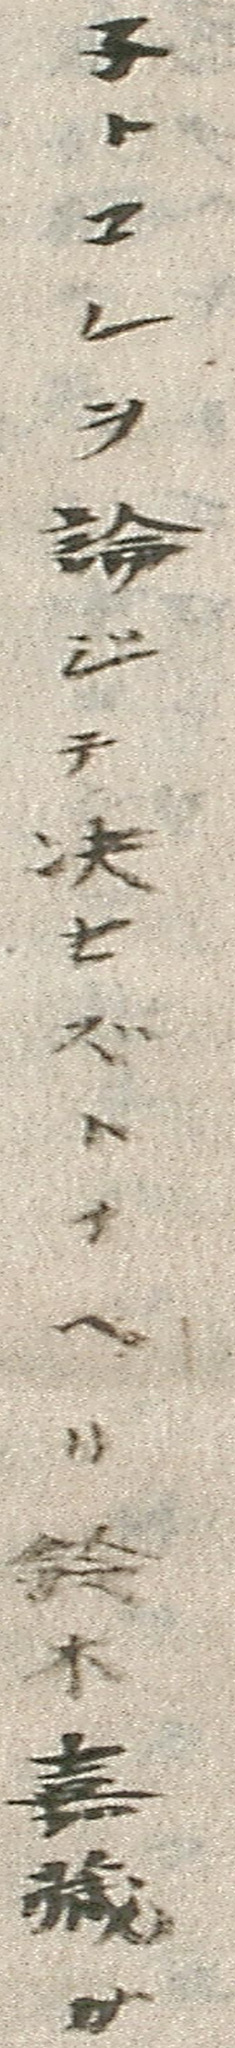子トコレヲ論ジテ決セズトイヘリ鈴木嘉蔵ガ
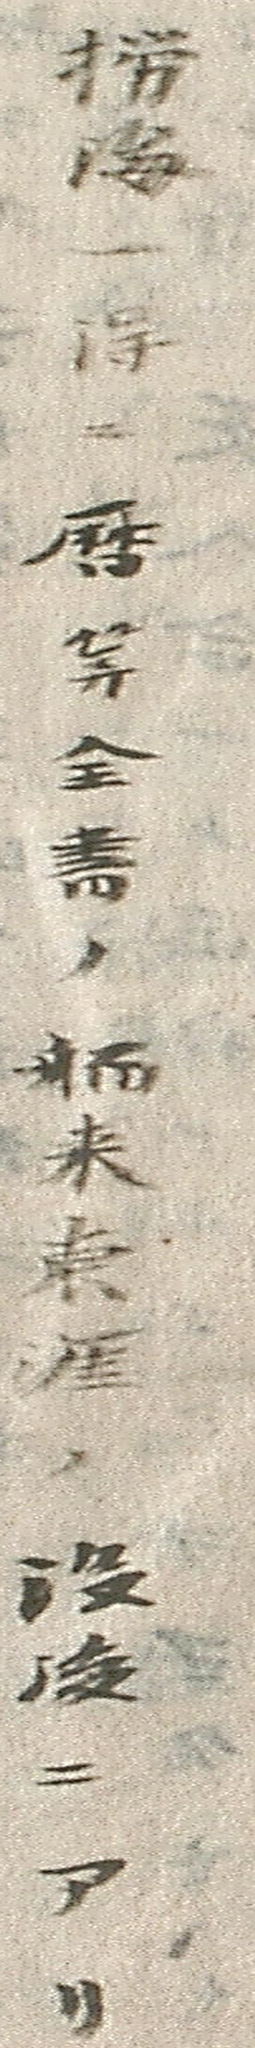撈海一深ニ暦等全書ノ舶来東涯ノ没後ニアリ
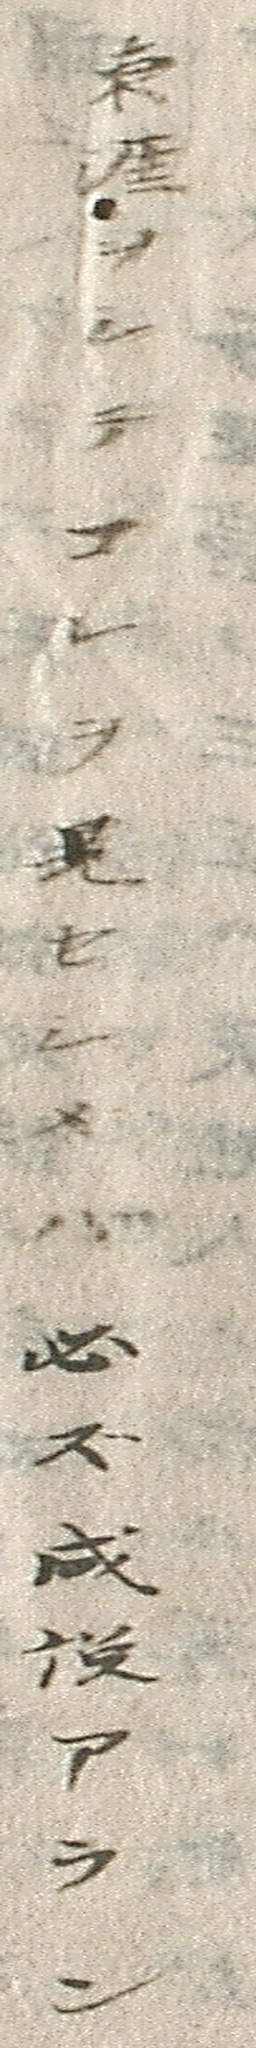東涯ヲシテコレヲ見セシメバ必ズ成説アラン
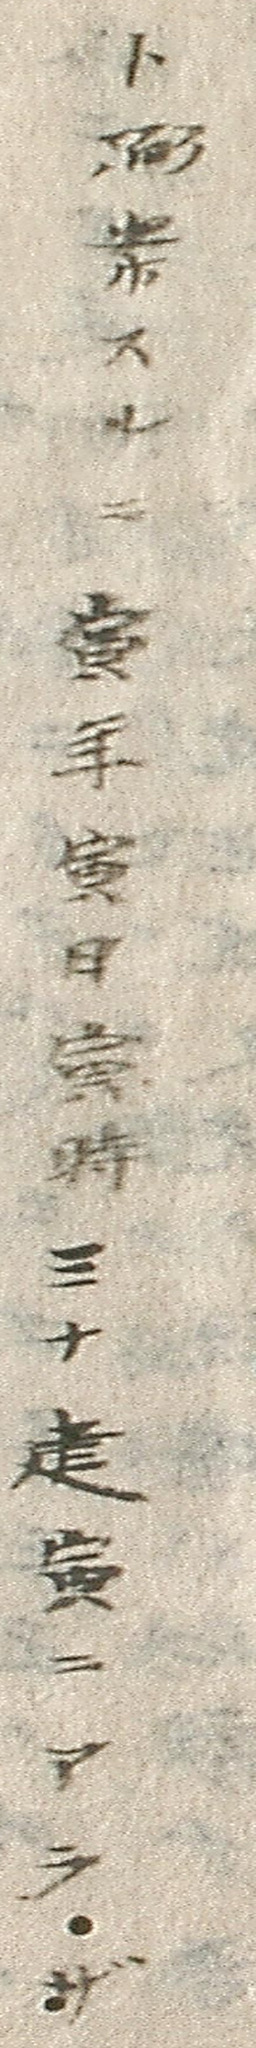ト弼案スルニ寅年寅日寅時ミナ建寅ニアラザ
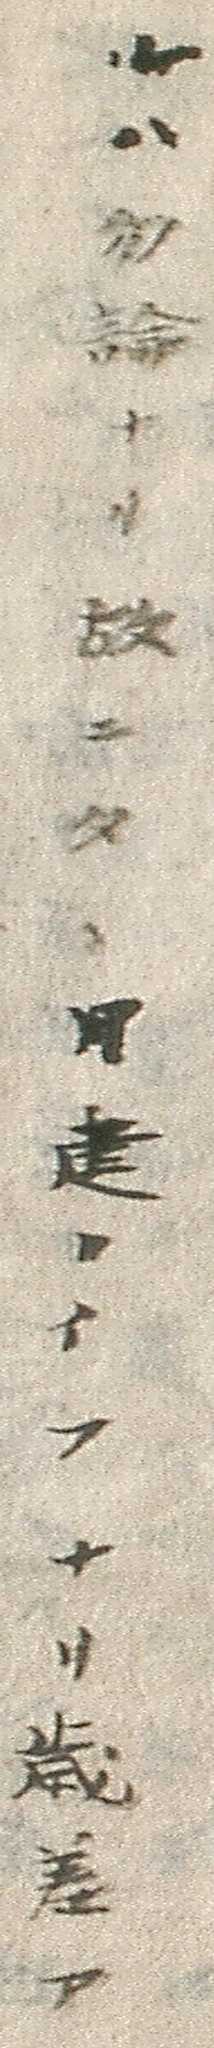ルハ勿論ナリ故ニタヽ月建ノイフナリ歳差ア
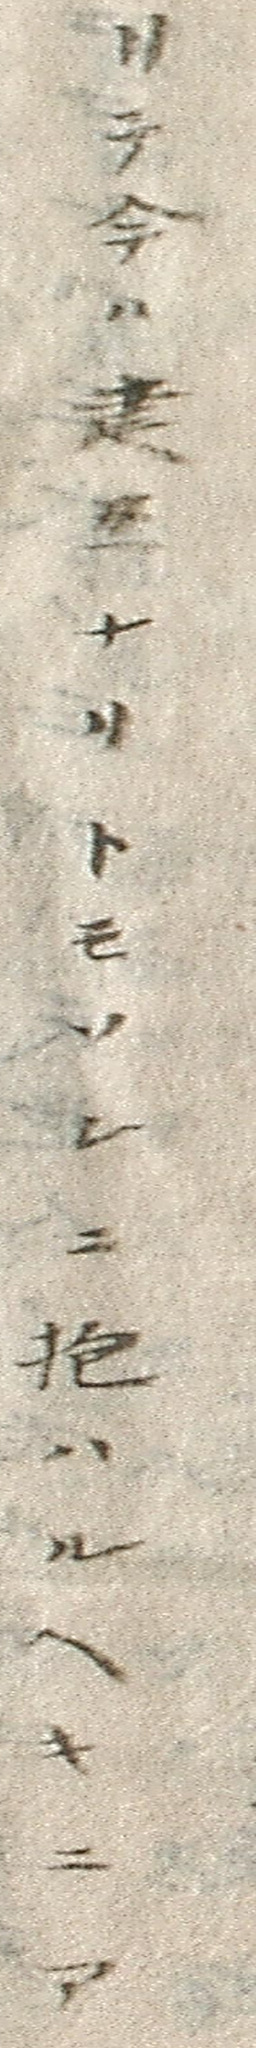リテ今ハ建丑ナリトモソレニ抱ハルヘキニア
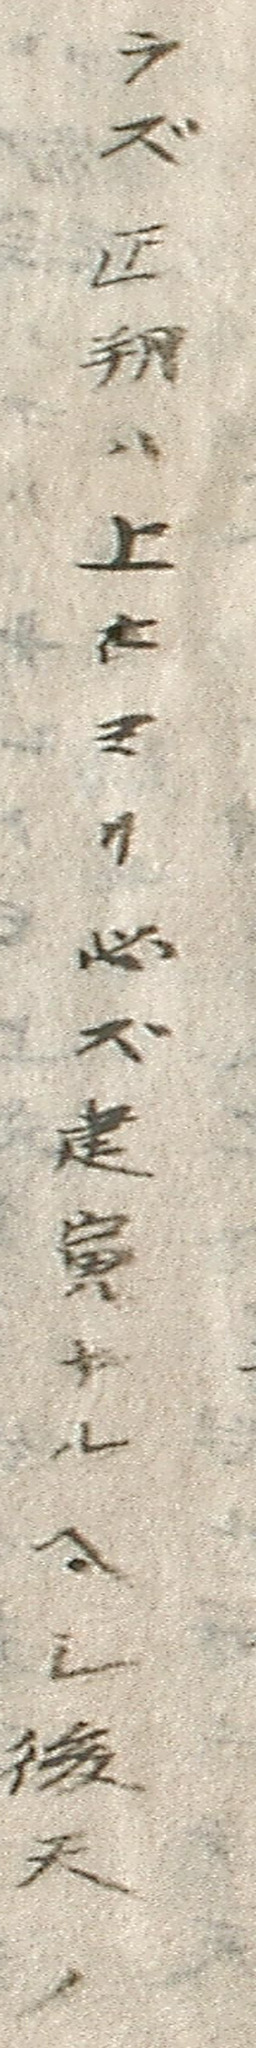ラズ正朔ハ上ニヨリ必ズ建寅ナルヘシ後天ノ
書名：天學便蒙図説
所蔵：東京大学地震研究所図書室 Earthquake Research Institute Library, The University of Tokyo, JAPAN
